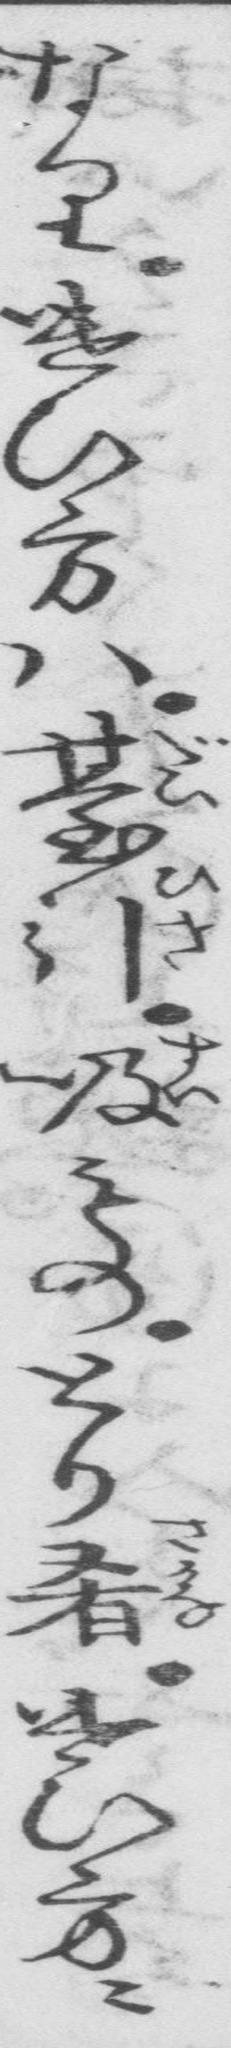なり。遣ひ方は。台引。吸もの。とり肴。遣ひ方に
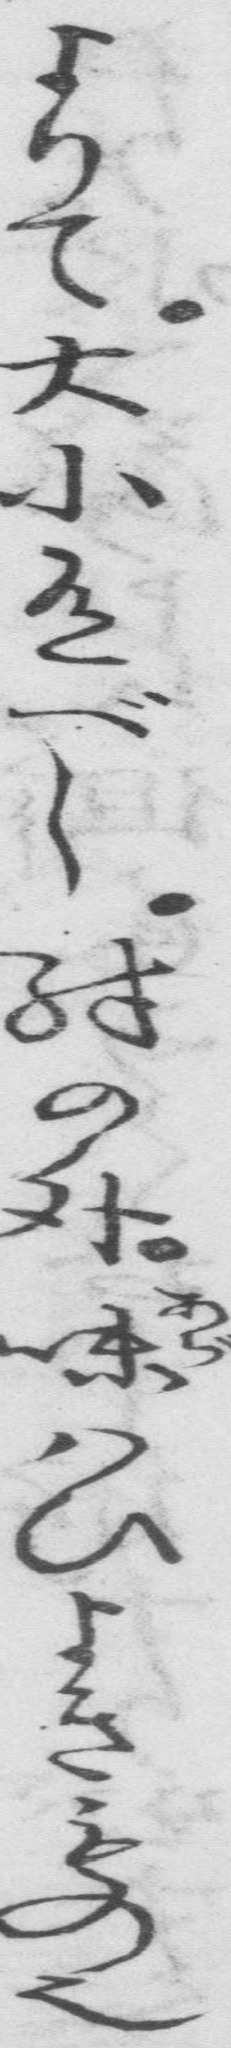よりて。大小有べし。殊の外。味はひよきもの也
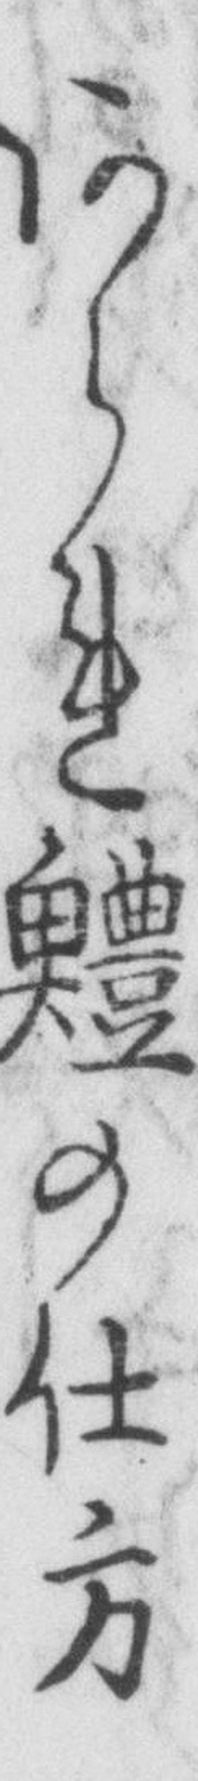あられ鱧の仕方

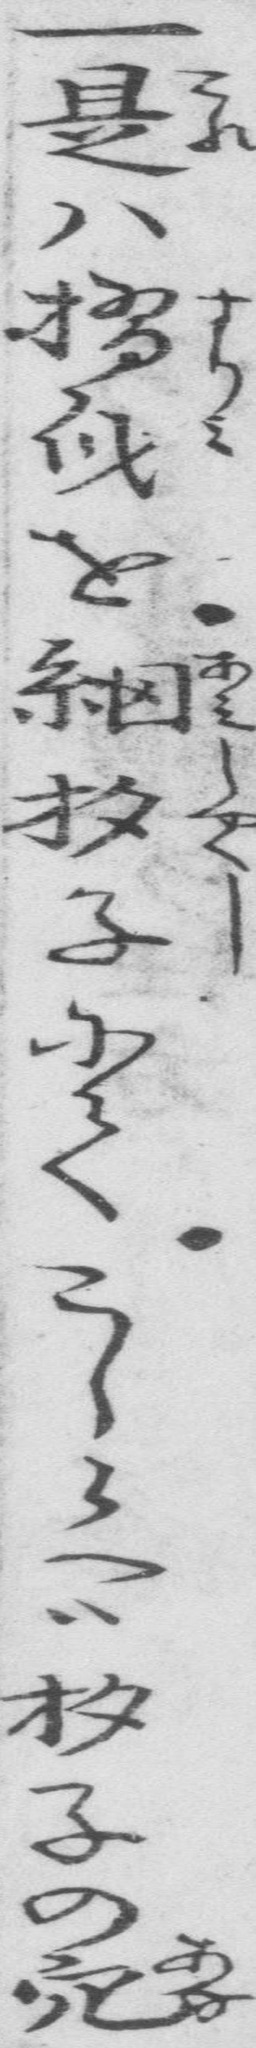一是は摺身を。網杓子にて。こし候へは杓子の穴
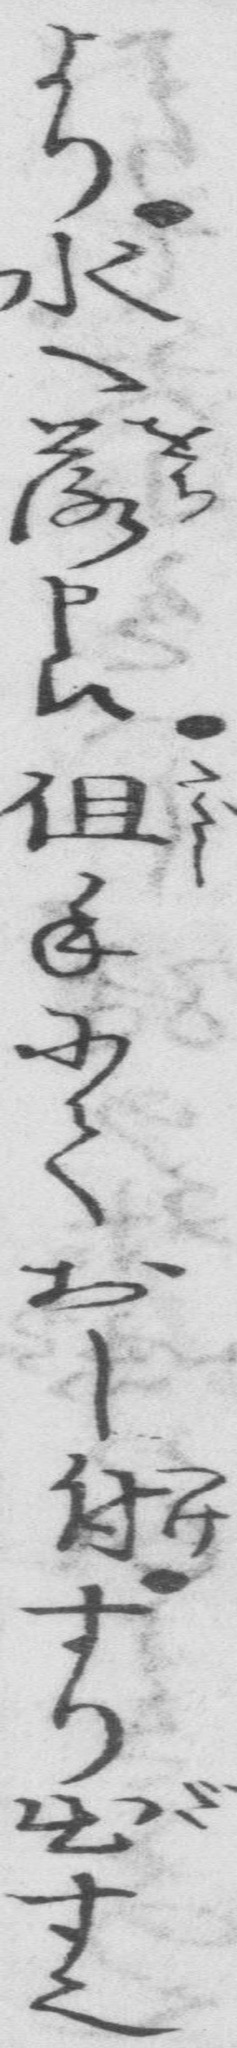より。水へ落申候。但手にておし付。すり出す也
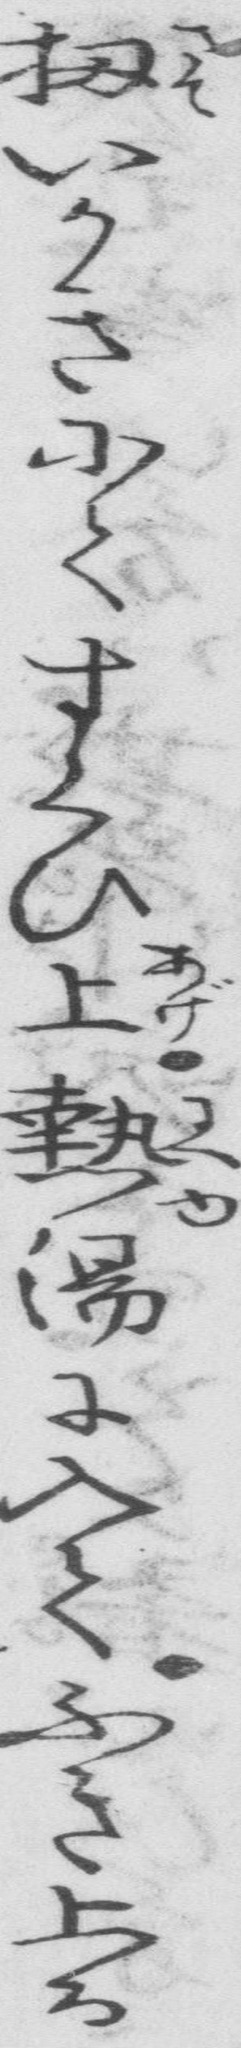扨いかきにてすくひ上。熱湯に入て。ふき上る
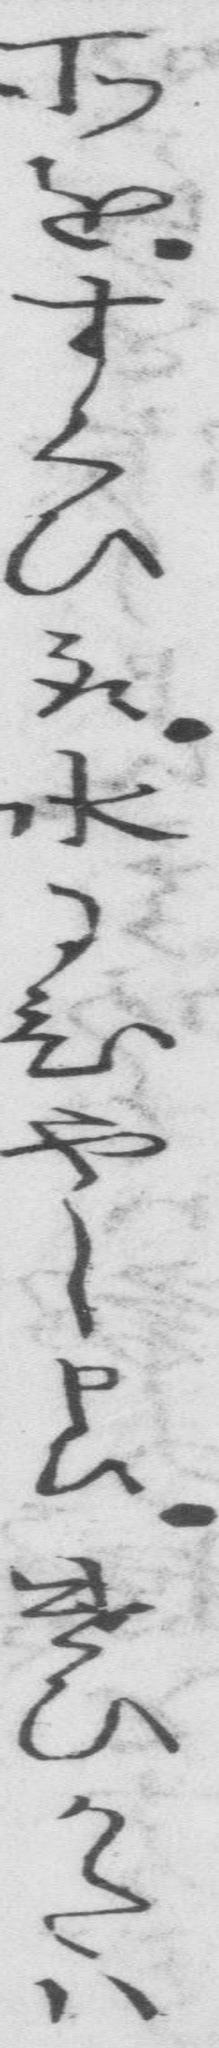所を。すくひ取。水にひやし申候。遣ひかたは
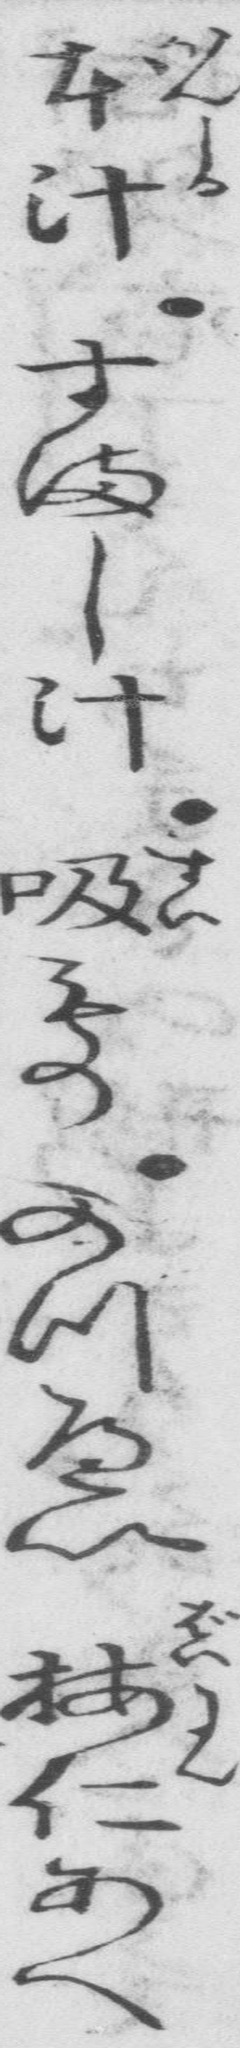本汁。すまし汁。吸もの。のつへい梅仁あへ
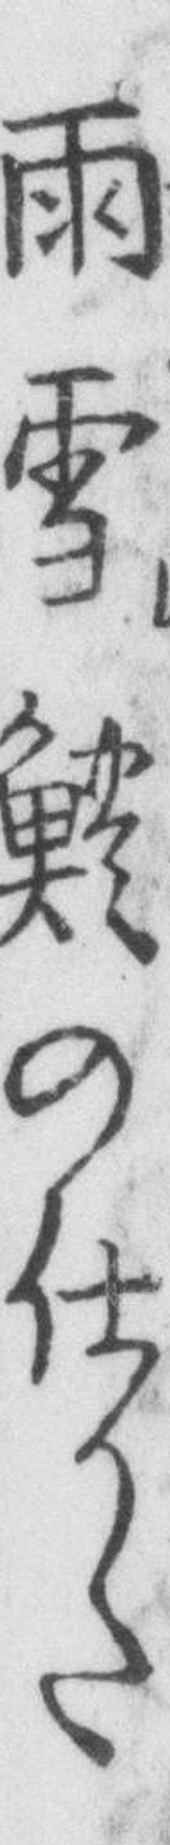雨雪鱧の仕かた
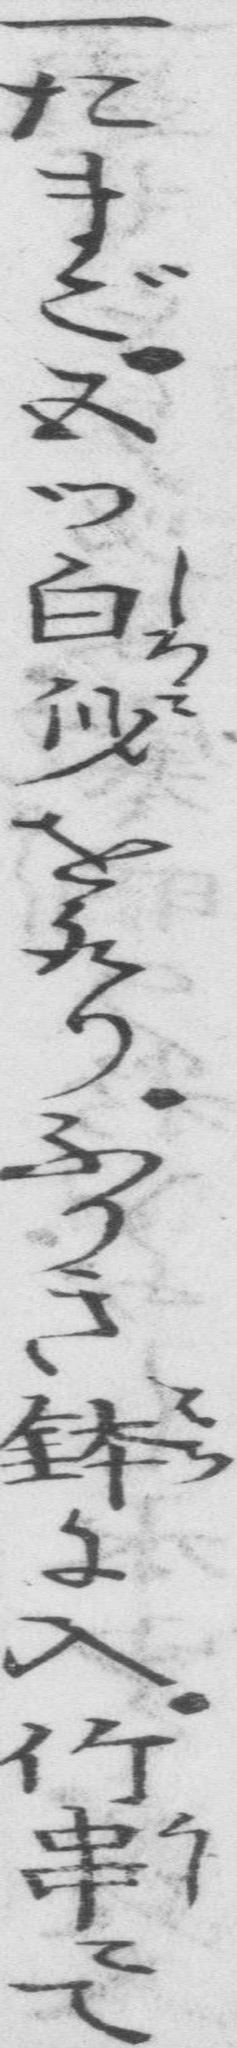一たまご。五ツ白身を取り。ふかき鉢に入。竹串にて
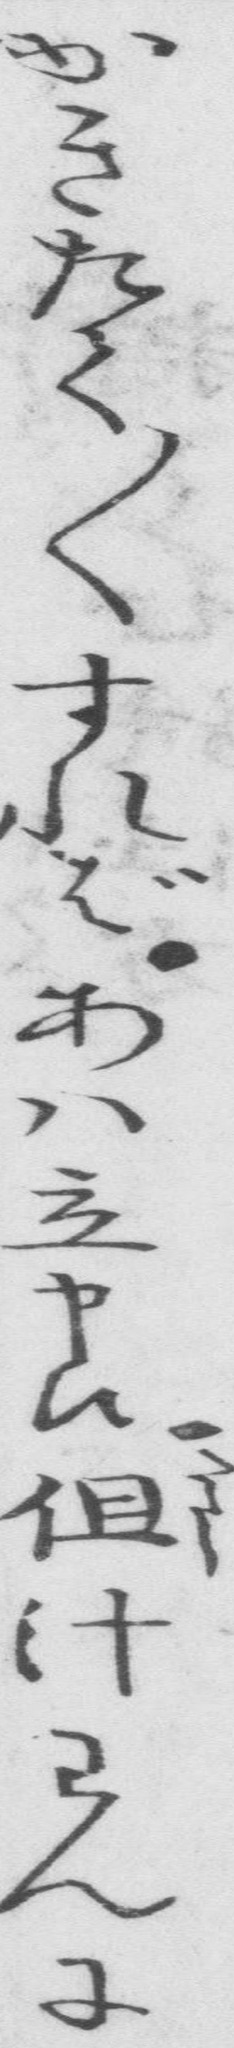かきたて〳〵すれば。あは立申候。但汁わんに
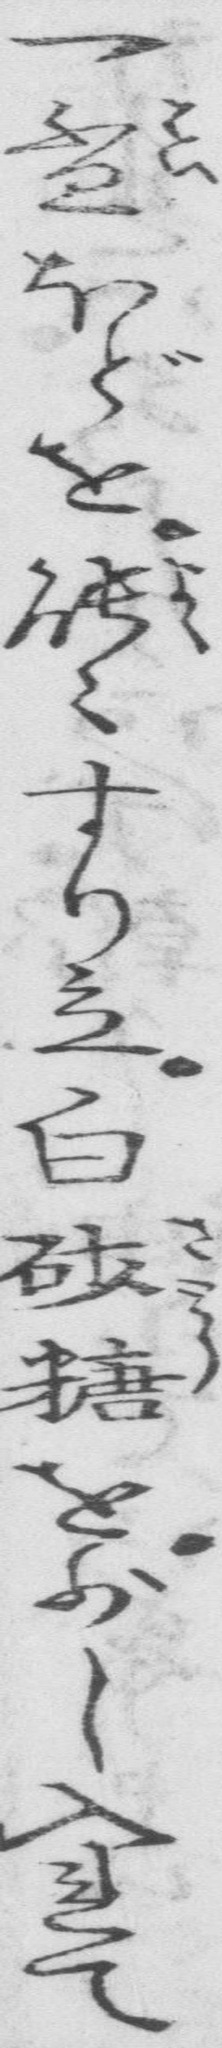一盃ほどを。能々すり立。白砂糖を。少し入れて
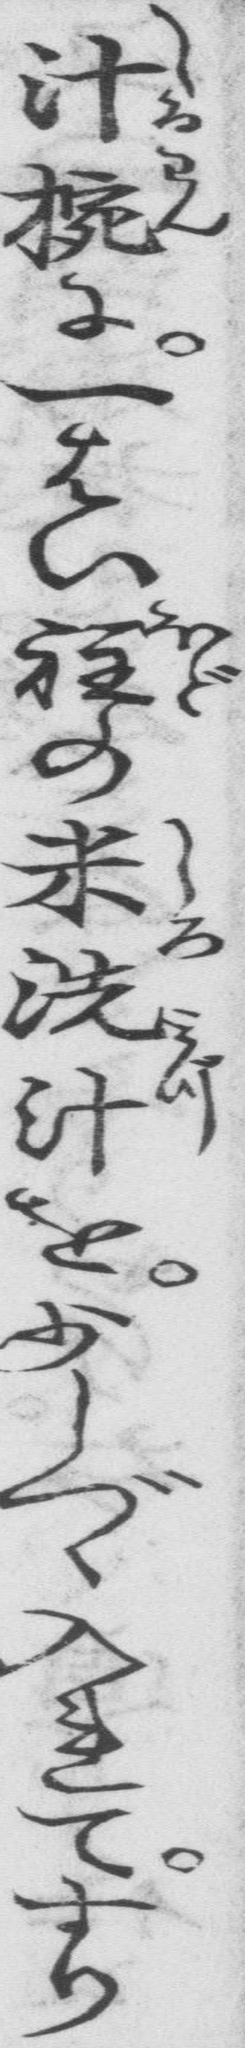汁椀に。一はい程の米洗汁を。少しづゝ入れて。すり
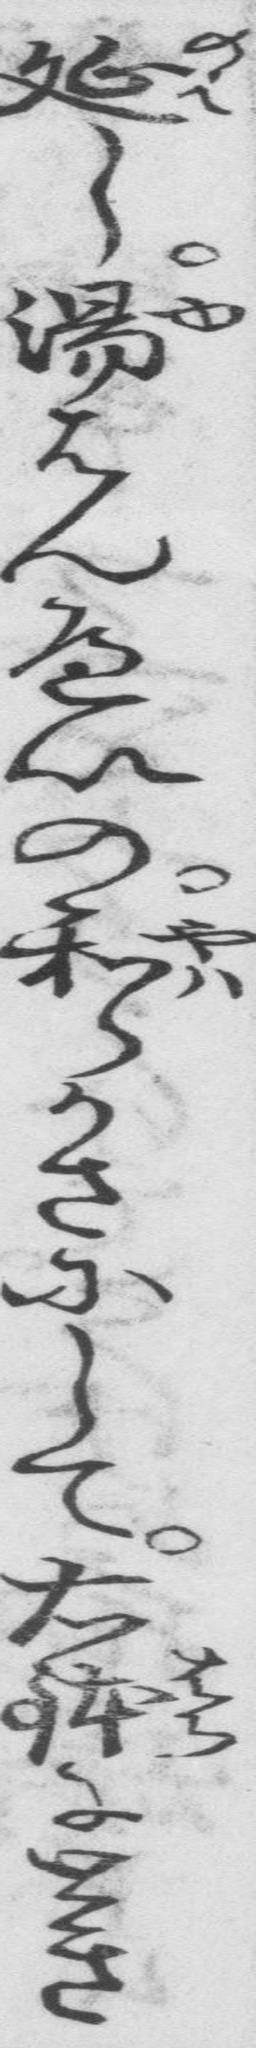延し。湯はんへいの。和らかさにして。右鉢にとき
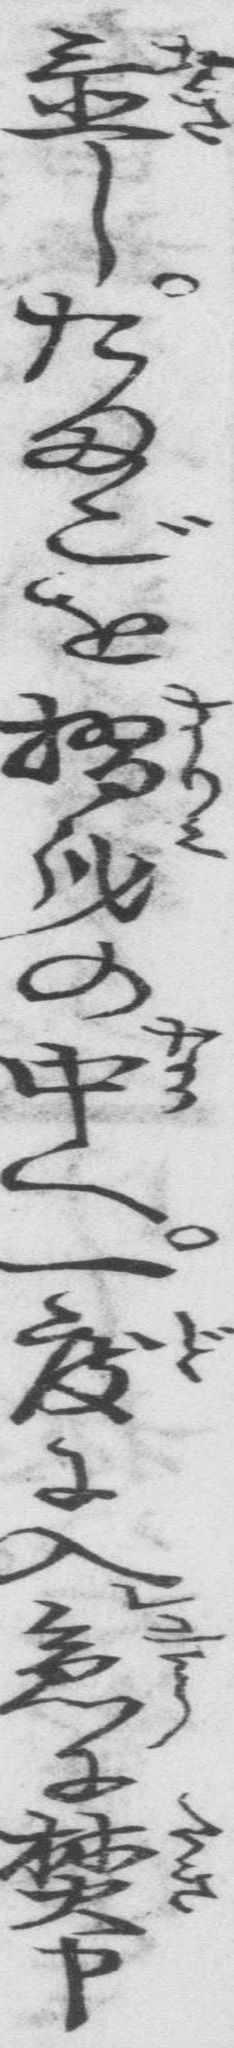置し。たまごを摺身の中へ。一度に入れ急に焚申
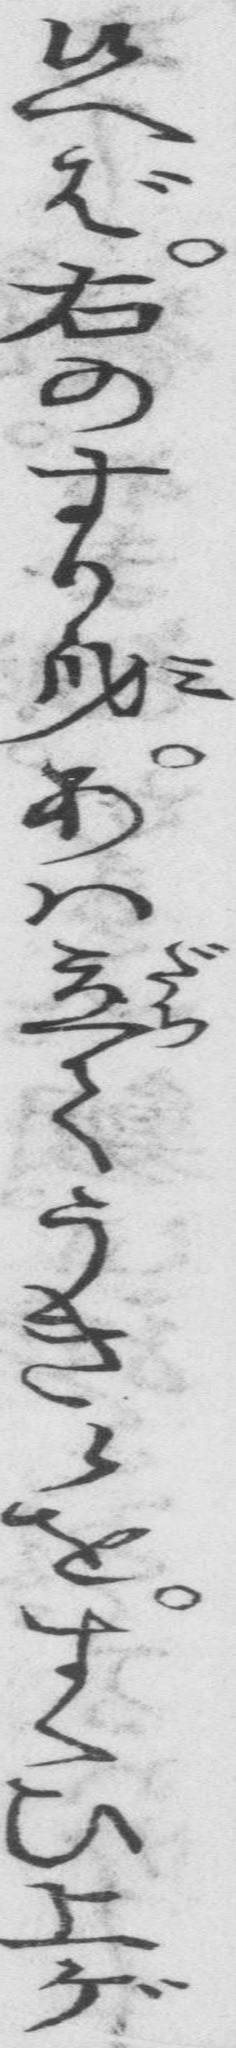候へば。右のすり身。あは立てうき候を。すくひ上げ
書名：萬寳料理秘密箱
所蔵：大阪府立大学学術情報センター 国文学研究資料館
